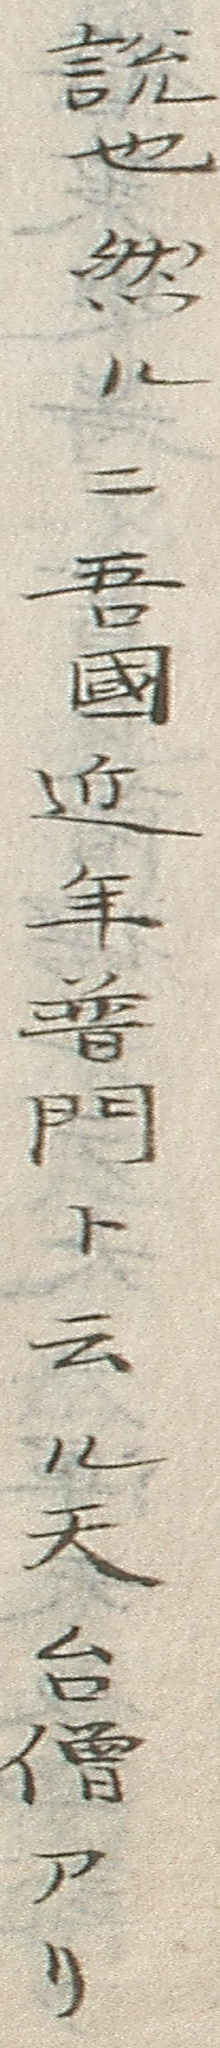説也然ルニ吾国近年普門ト云ル天台僧アリ
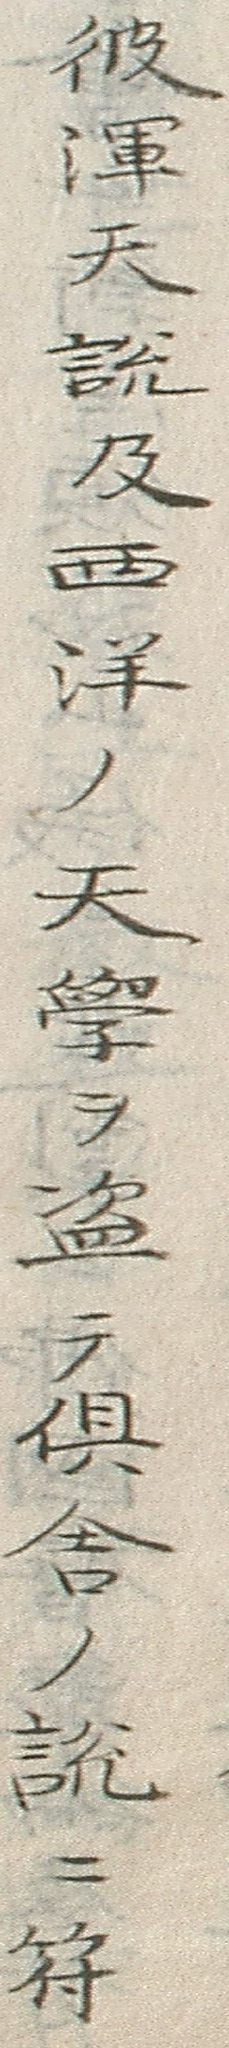彼渾天説及西洋ノ天学ヲ盗テ倶舎ノ説ニ符

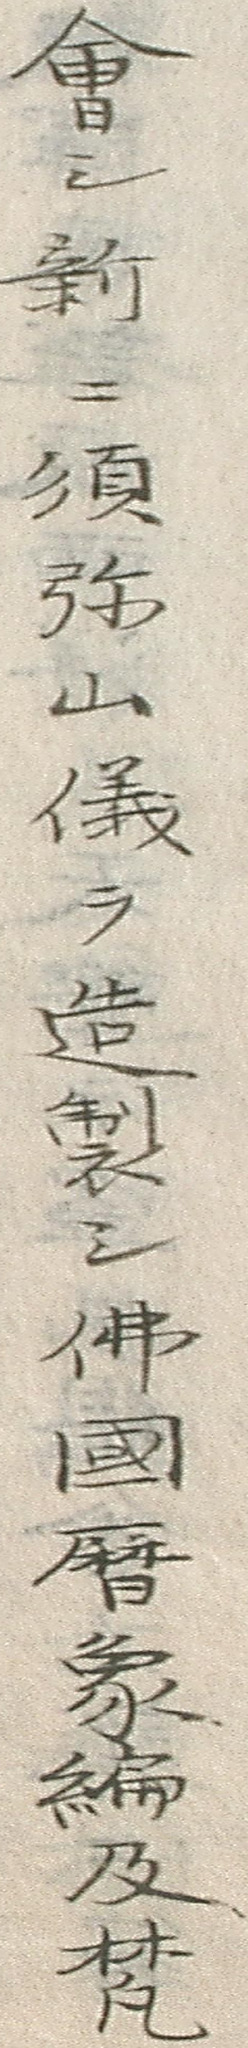会シ新ニ須弥山儀ヲ造製シ仏国暦象編及梵
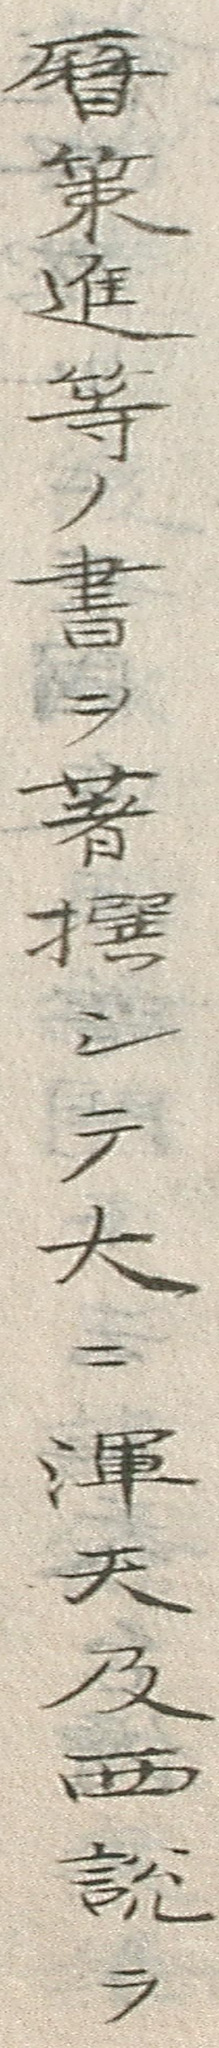暦策進等ノ書ヲ著撰シテ大ニ渾天及西説ヲ
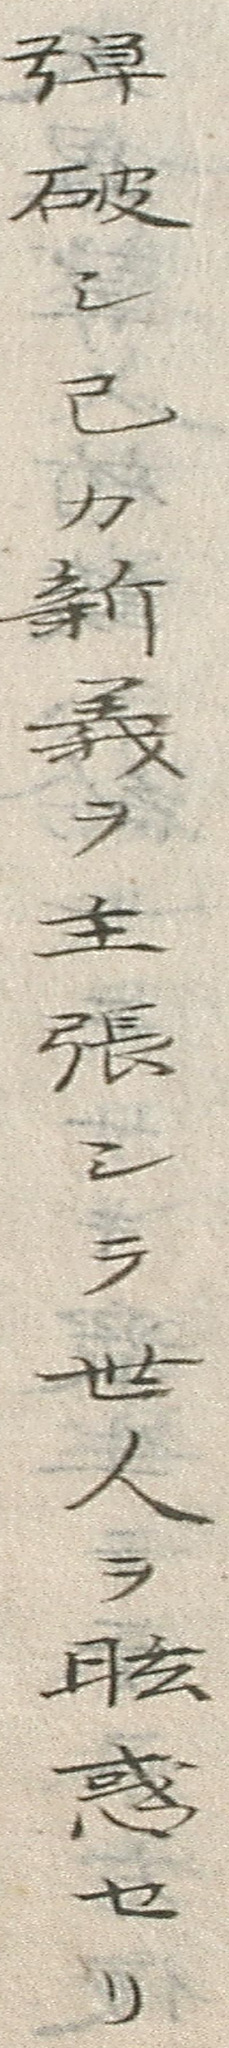弾破シ己カ新義ヲ主張シテ世人ヲ眩惑セリ
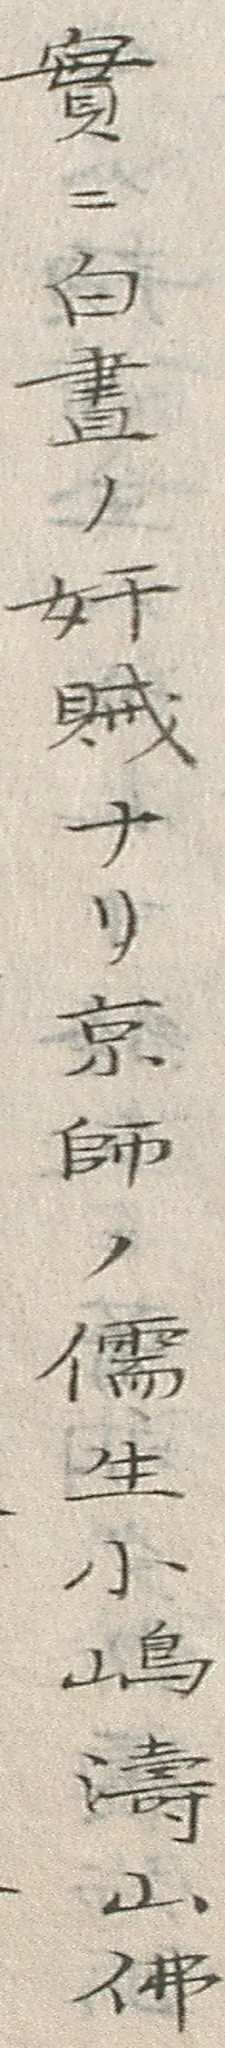実ニ白昼ノ奸賊ナリ京師ノ儒生小嶋濤山仏
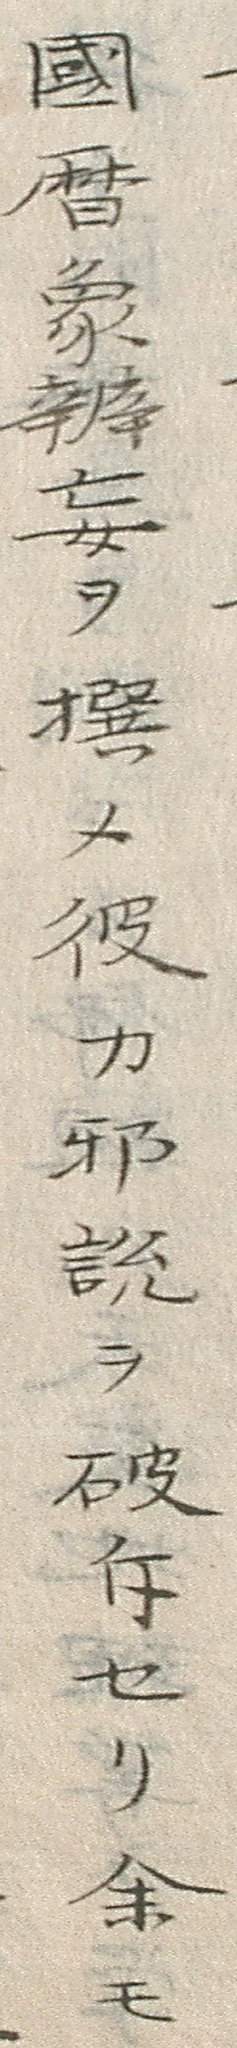国暦象弁妄ヲ撰シテ彼カ邪説ヲ破斥セリ余モ
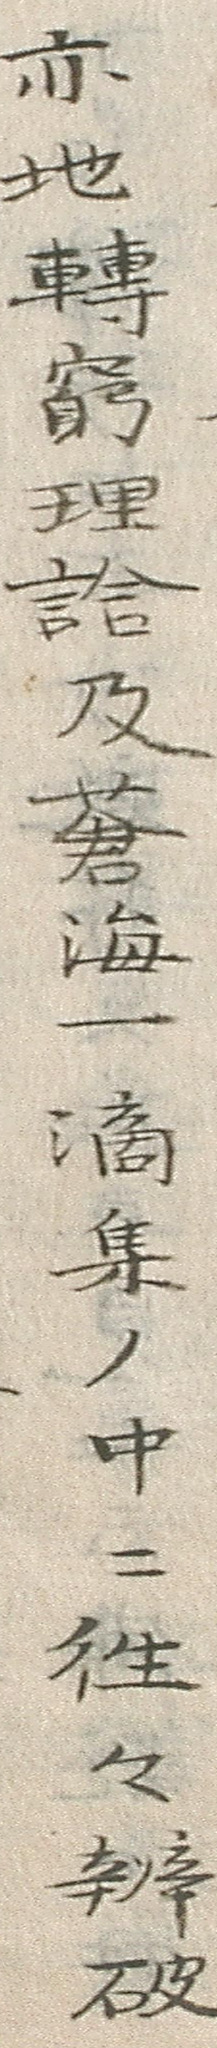亦地転窮理詥及蒼海一滴集ノ中ニ往々弁破
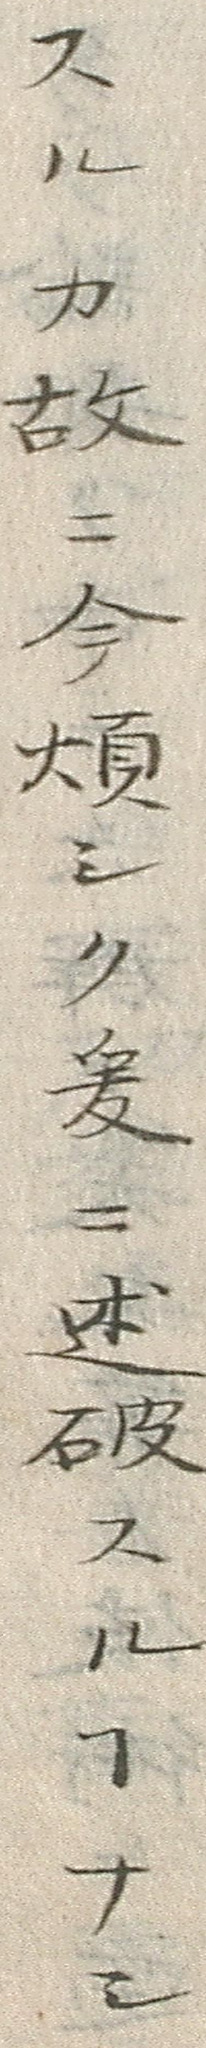スルカ故ニ今煩シク爰ニ述破スルコトナシ
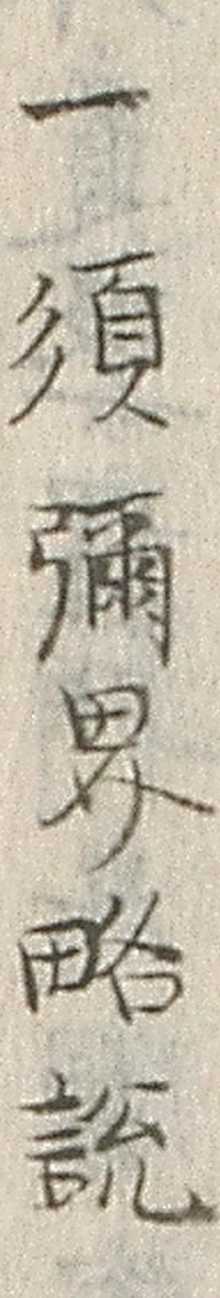一須弥界略説
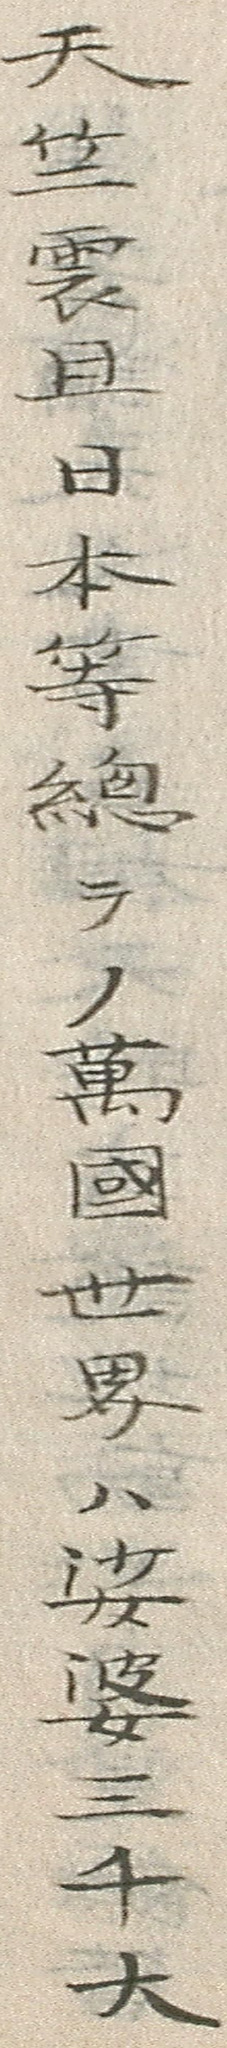天竺震旦日本等総テノ万国世界ハ娑婆三千大
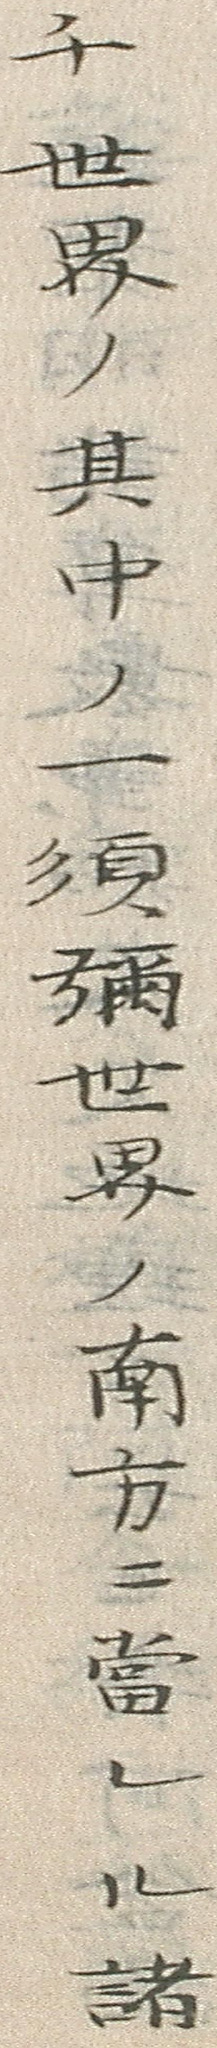千世界ノ其中ノ一須弥世界ノ南方ニ当レル諸
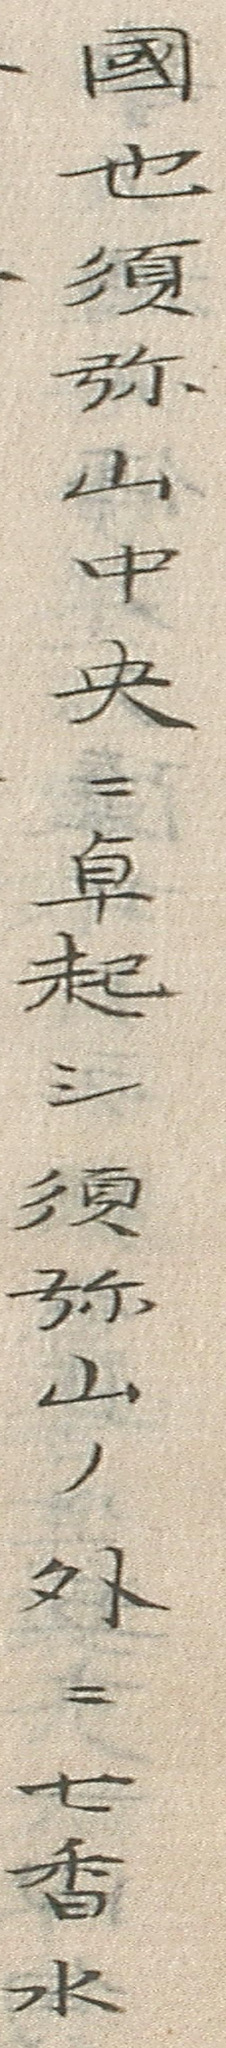国也須弥山中央ニ卓起シ須弥山ノ外ニ七香水
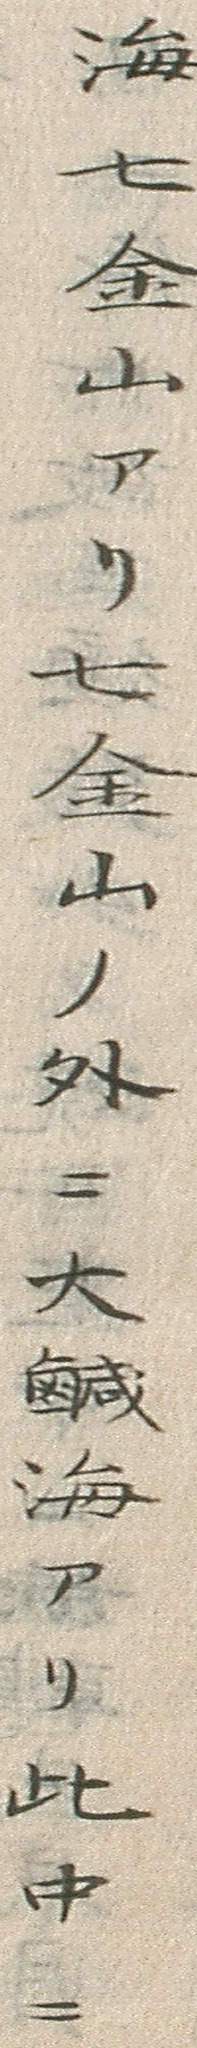海七金山アリ七金山ノ外ニ大鹹海アリ此中ニ
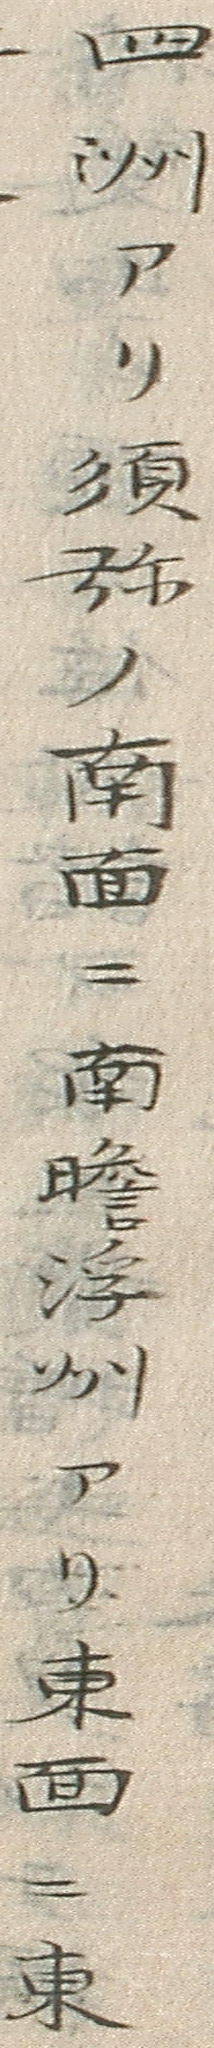四洲アリ須弥ノ南面ニ南瞻浮州アリ東面ニ東
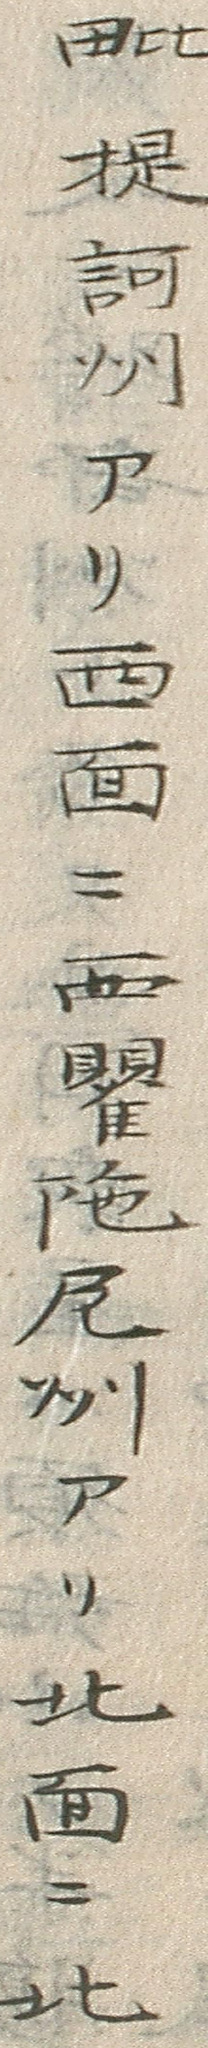毘提訶州アリ西面ニ西瞿陁尼州アリ北面ニ北
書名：天學略名目羽翼　全
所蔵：東京大学地震研究所図書室 Earthquake Research Institute Library, The University of Tokyo, JAPAN
